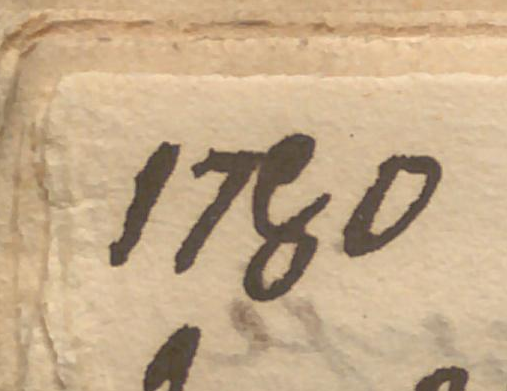1780
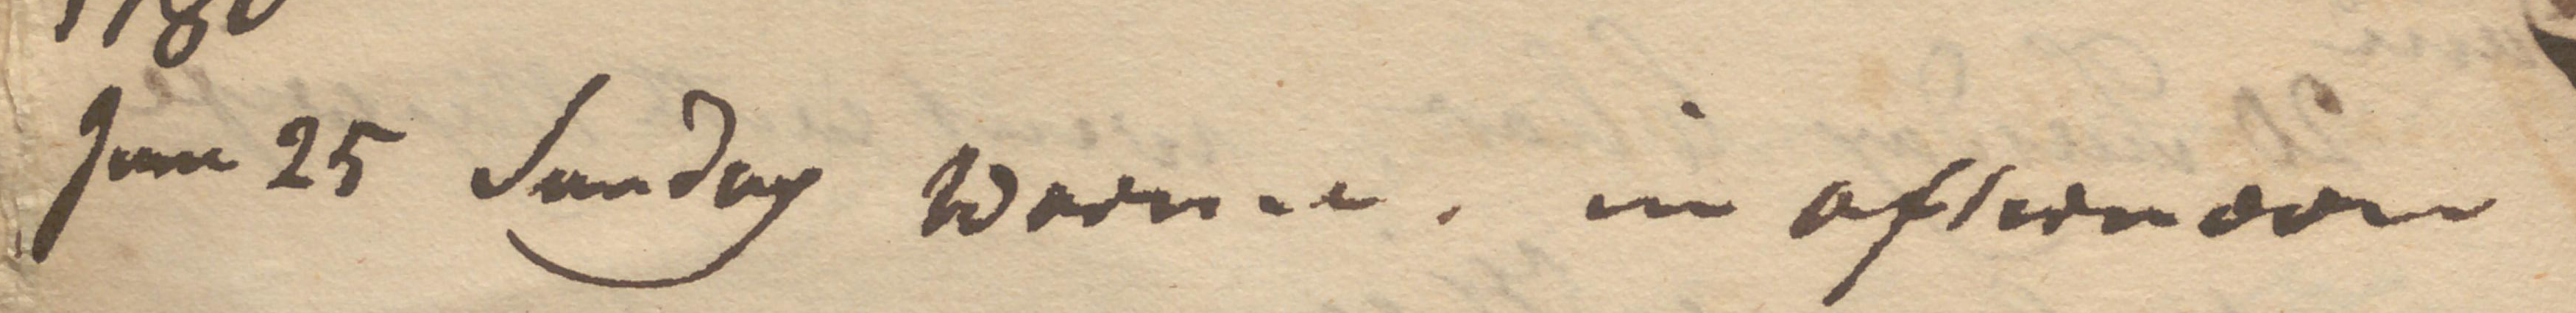Jue 25 Sunday warm, in afternoon
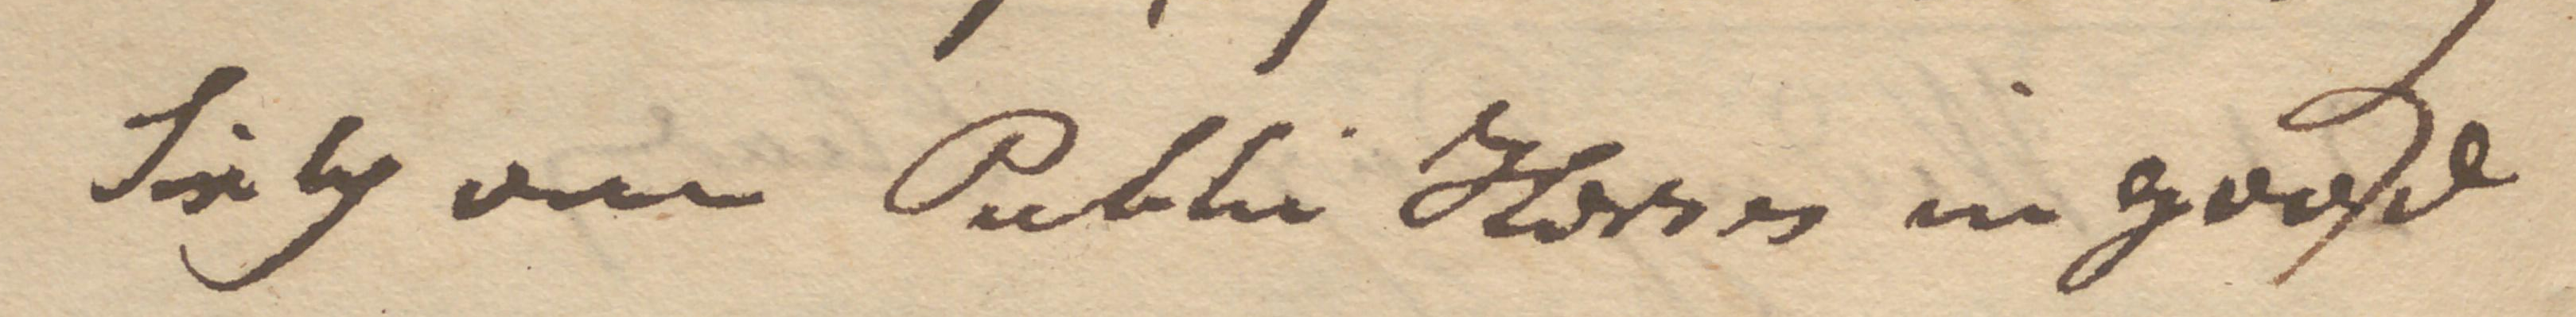Sixty one Publi Horses in good
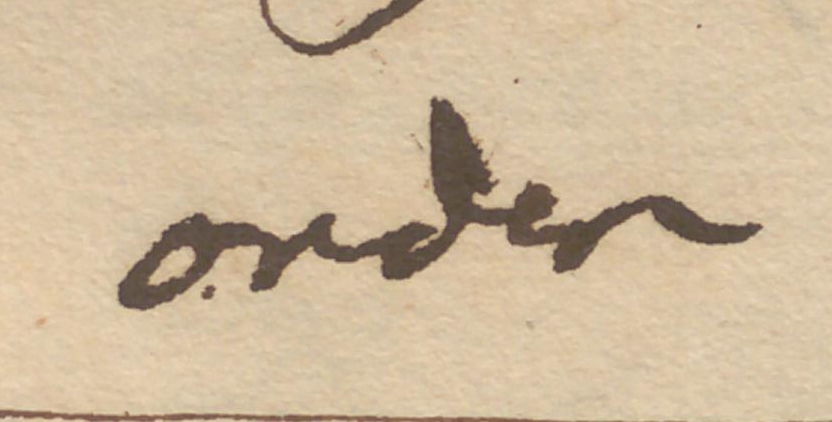order
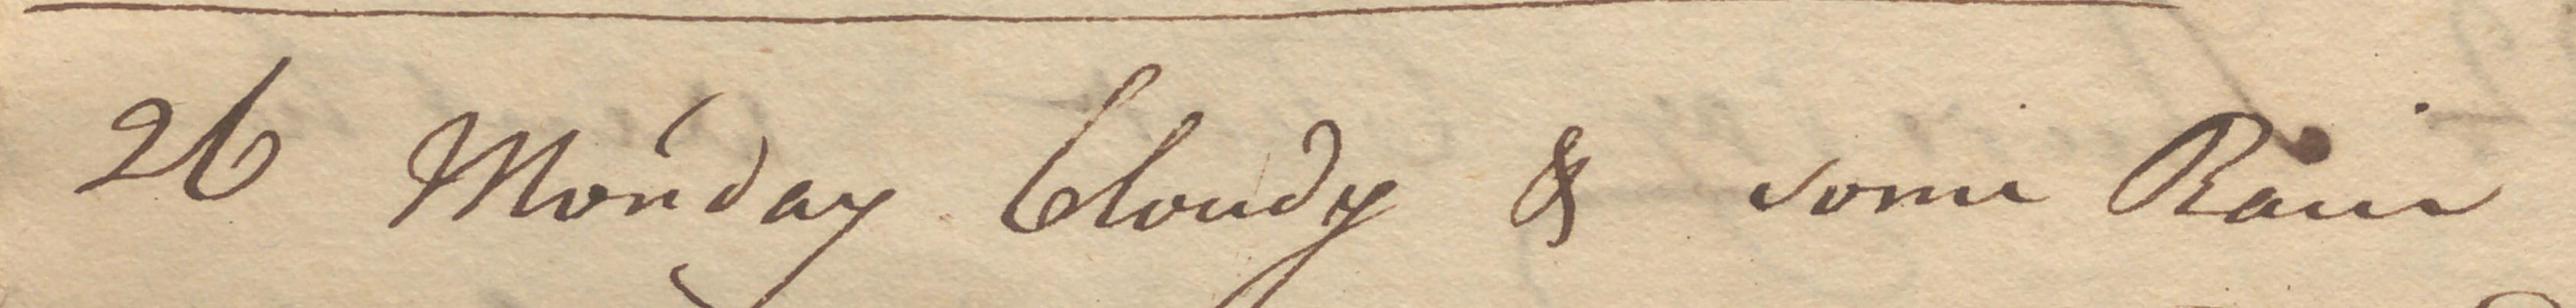26 Monday Cloudy & some Rain
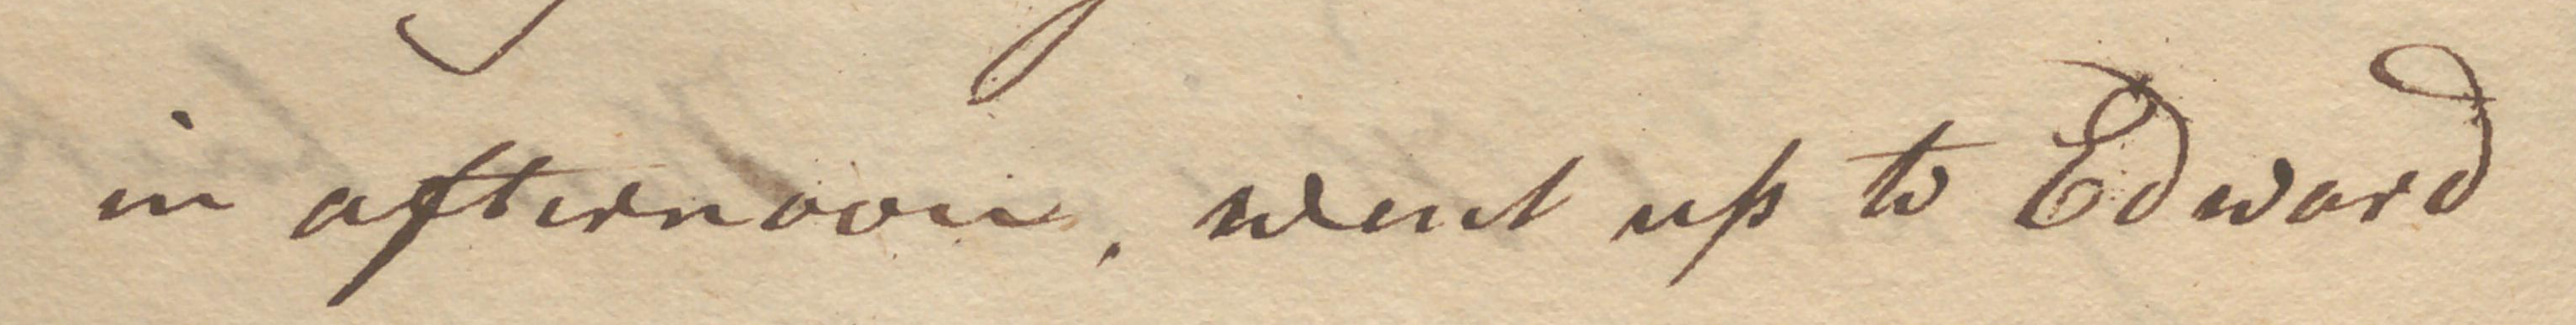in afternoon went up to Edward
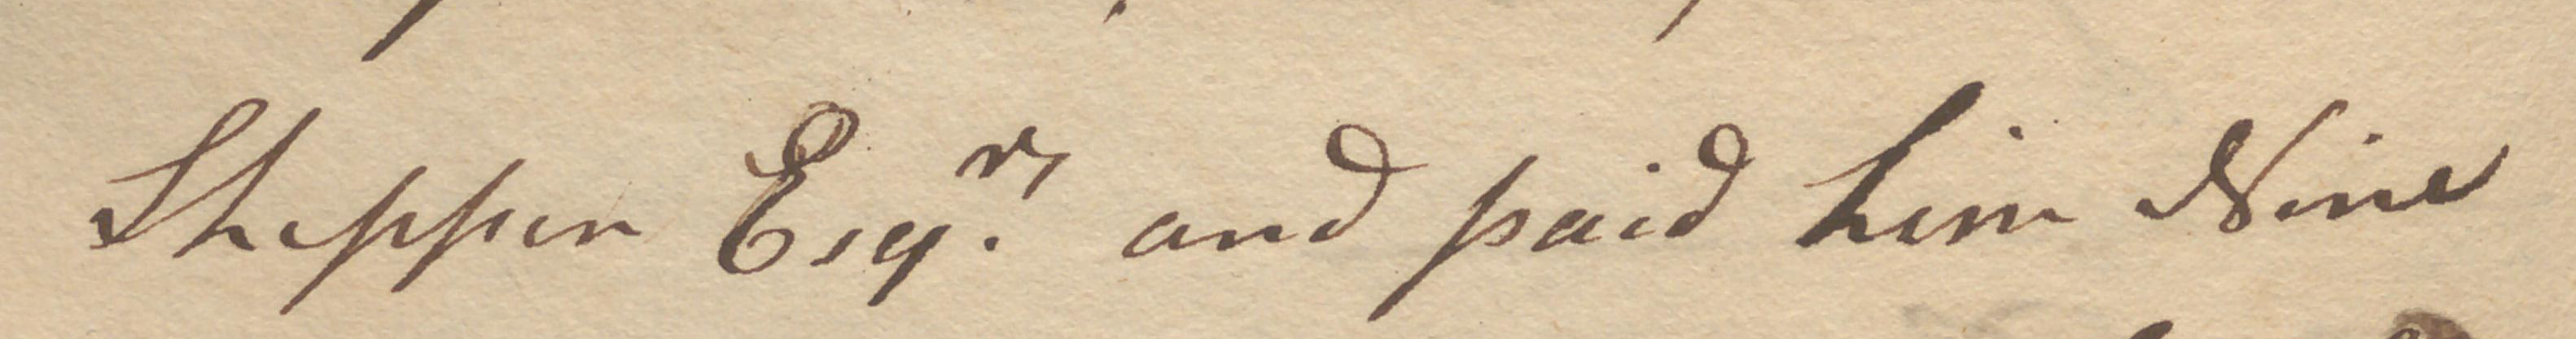Shippen Esq^r. and paid him Nine
